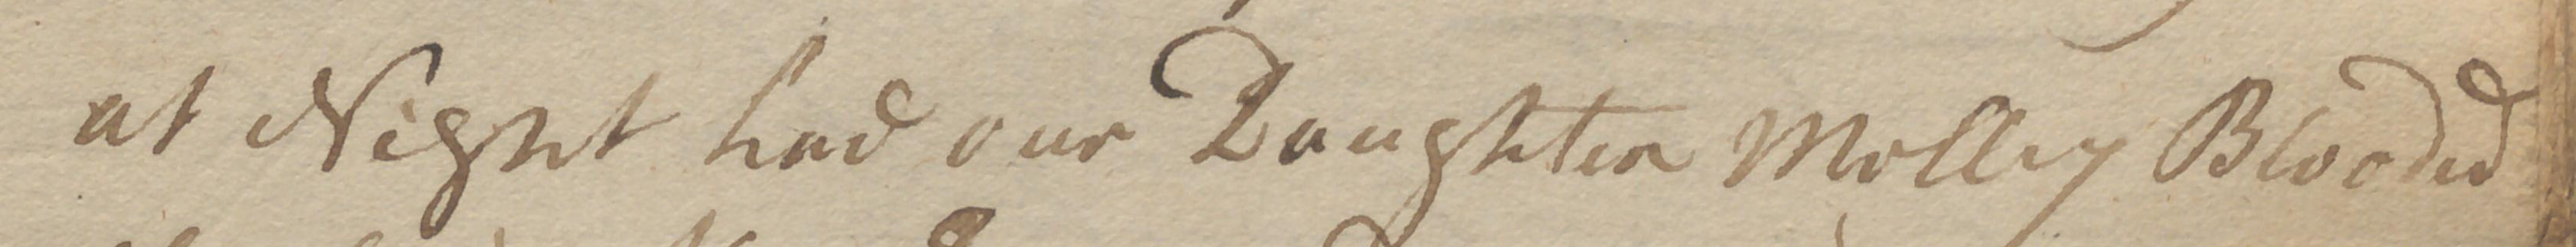at Night had our Daughter Molley Blooded
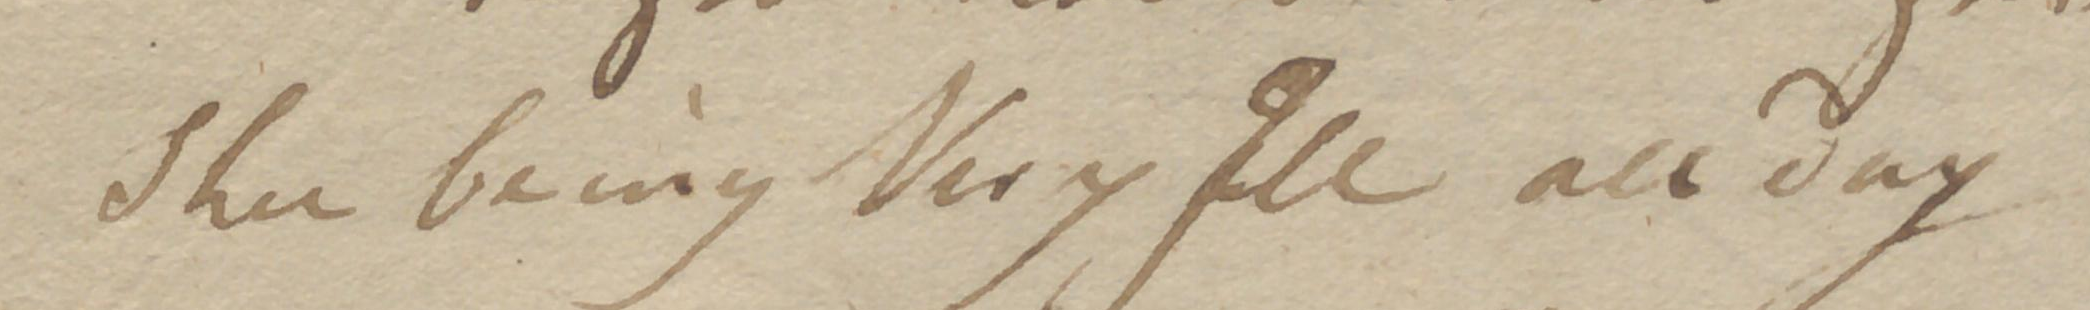She being Very Ill all day
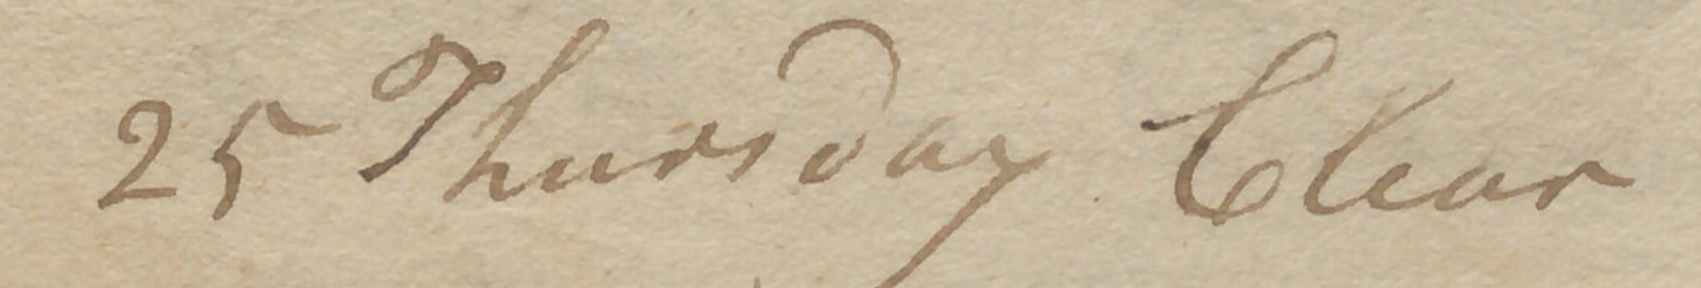25 Thursday Clear
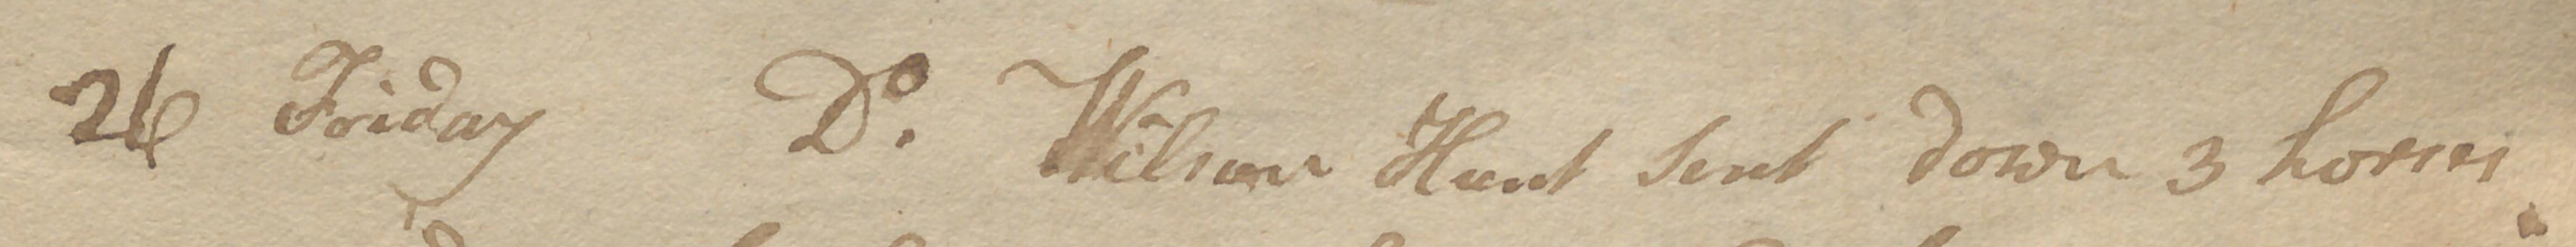26 Friday D^o. Wilson Hunt sent down 3 horses
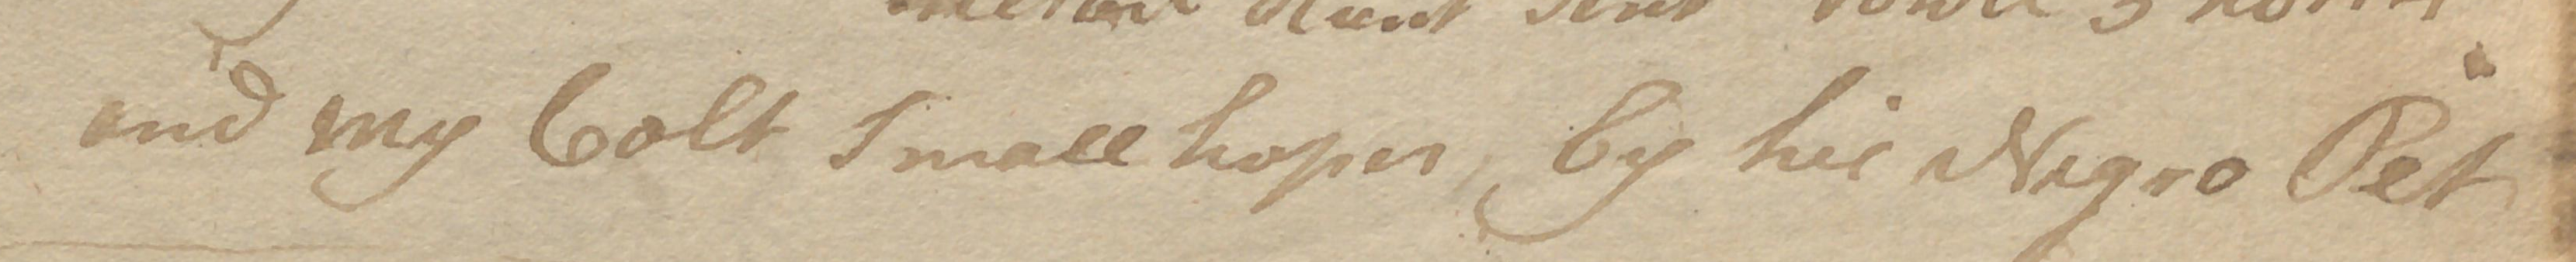and my Colt small hopes, by his Negro Pet
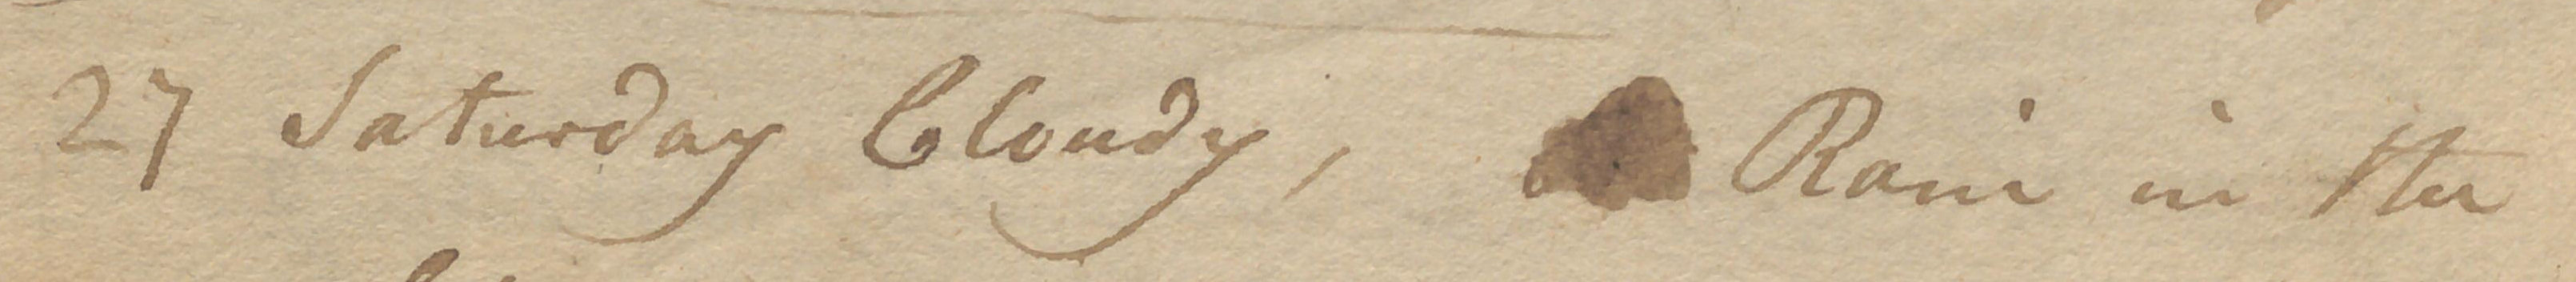27 Saturday Cloudy, [__] Rain in thee
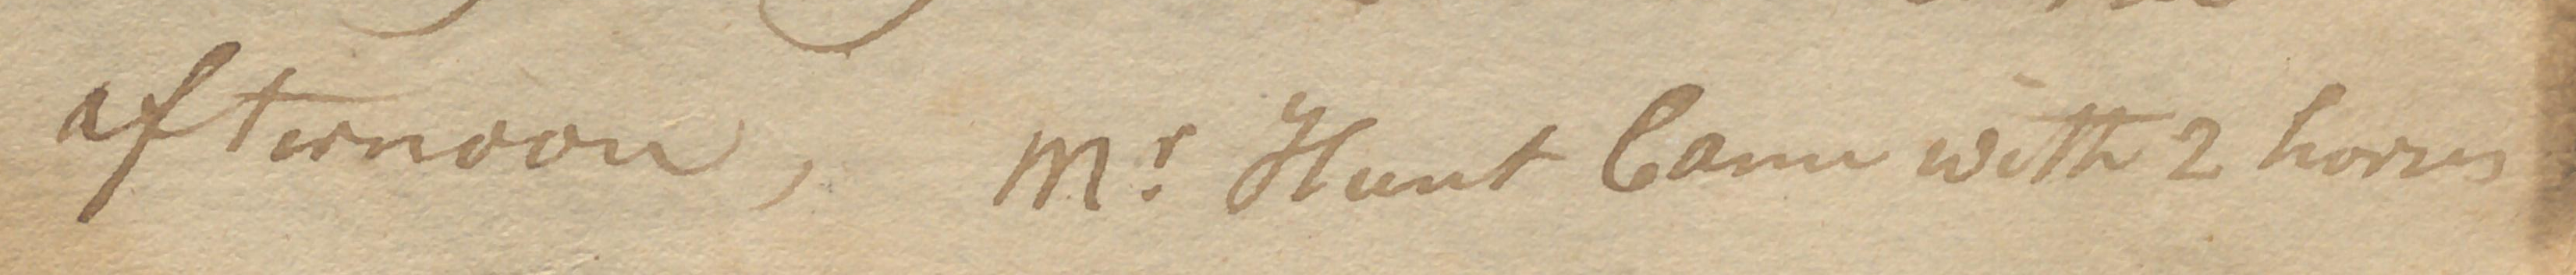afternoon, M^r. Hunt Came with 2 horses
